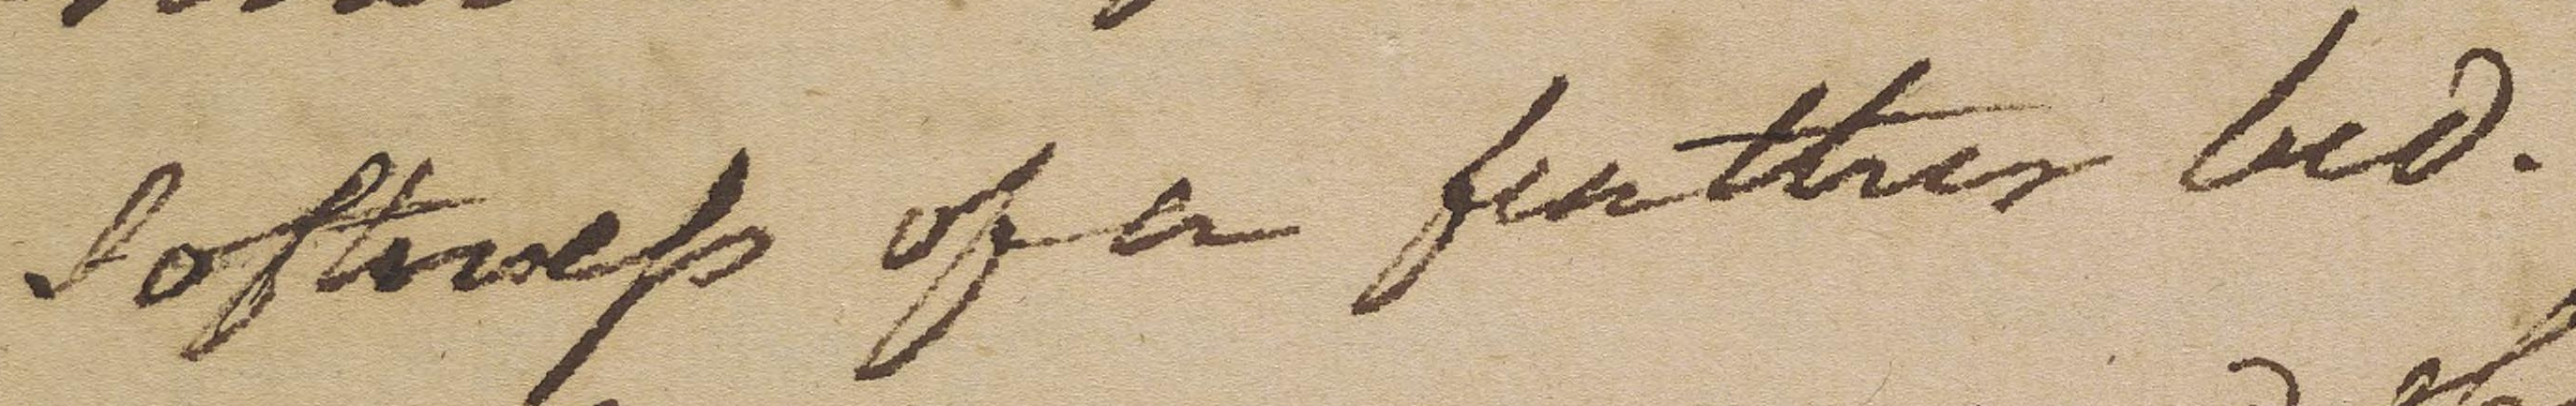softness of a feather bed.
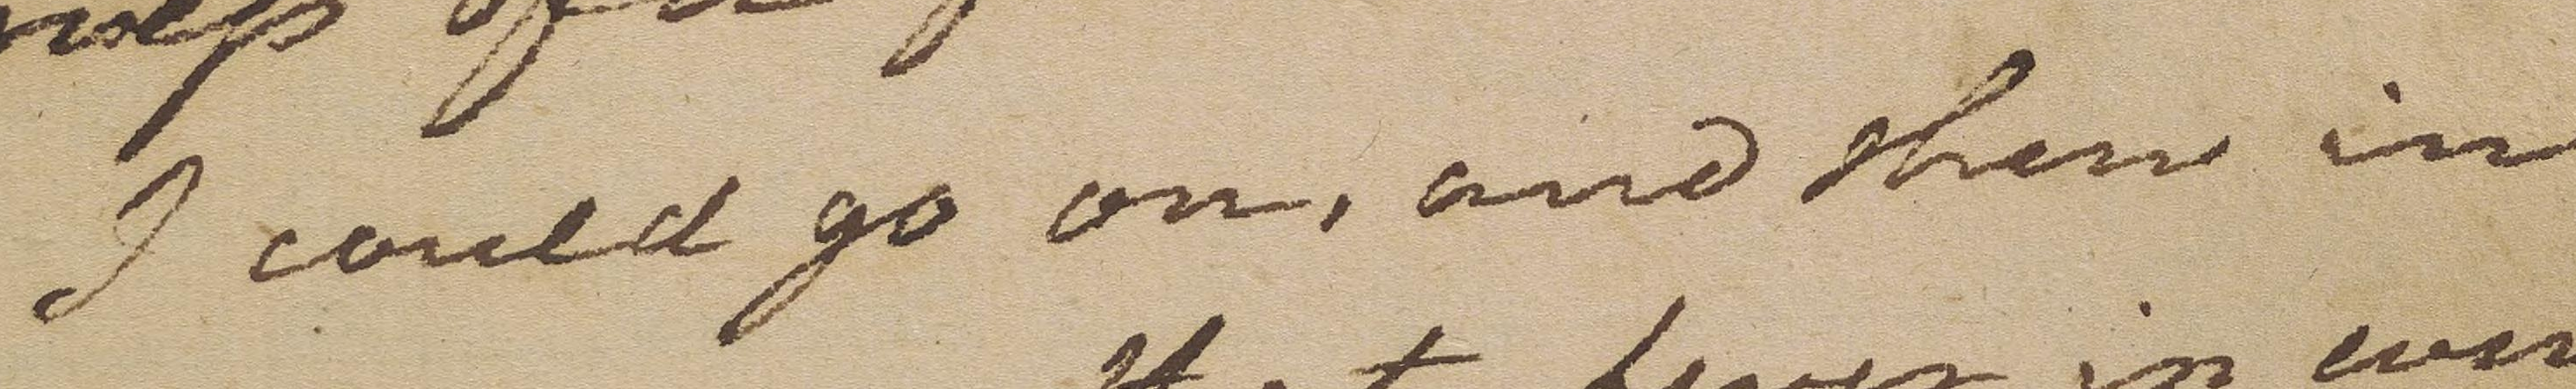I could go on, and then in
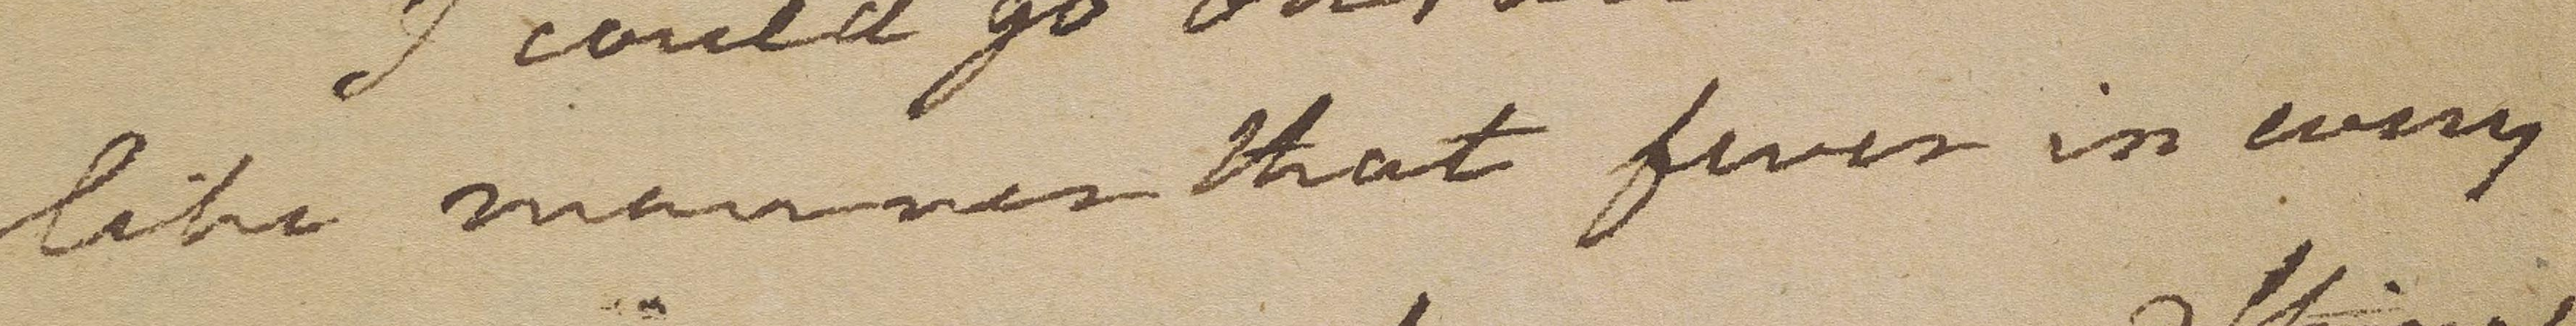like manner that fever in every
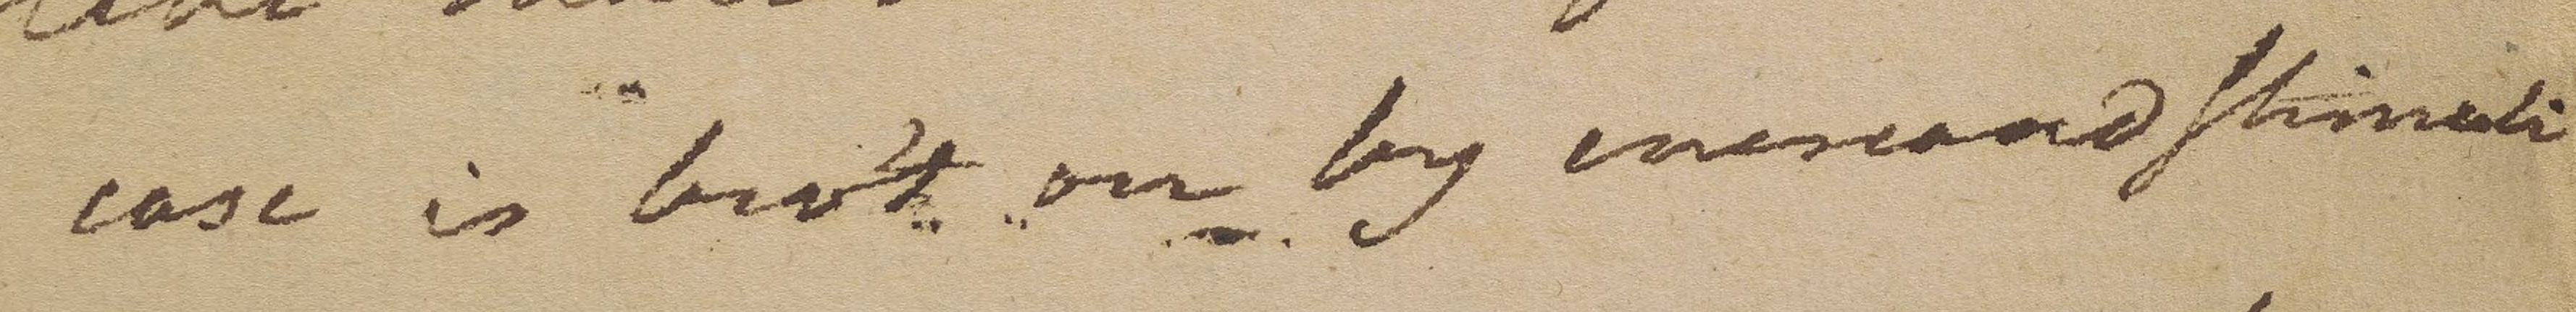case is bro't on by encreased stimuli
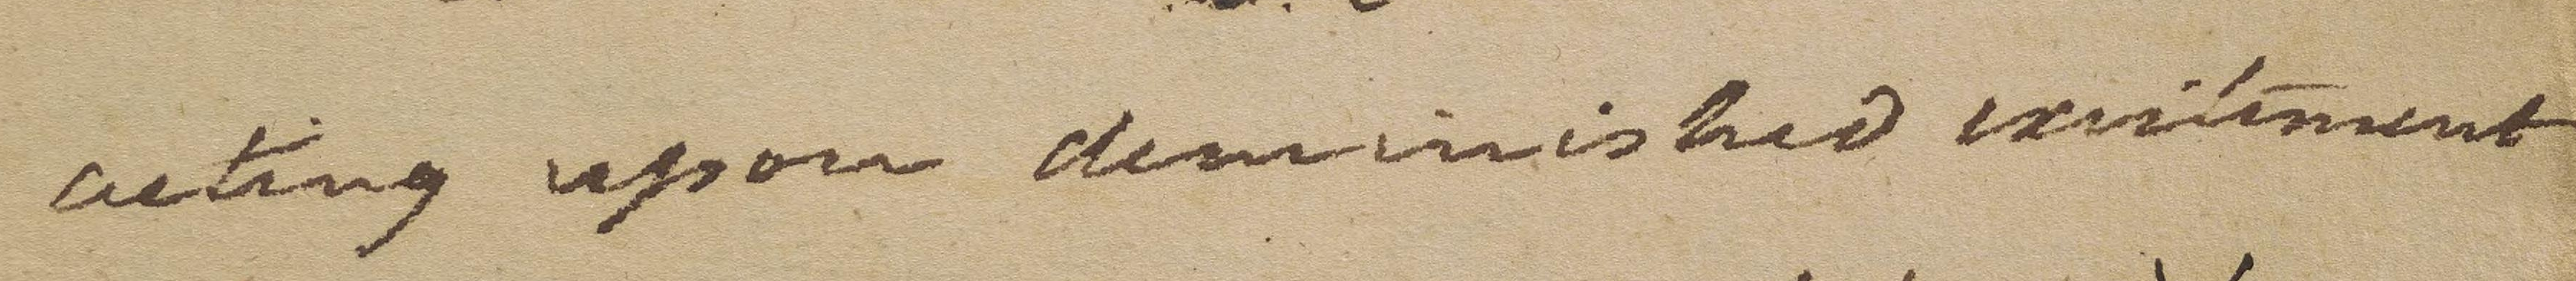acting upon diminished excitement
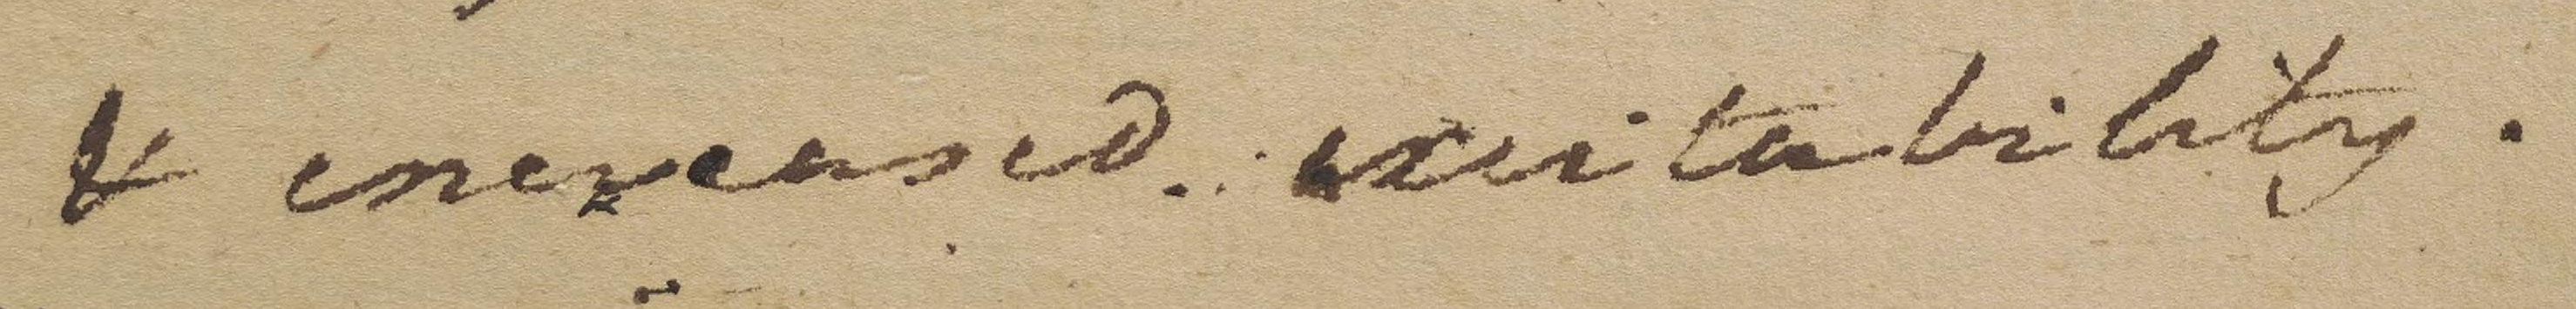& encreased excitability.
